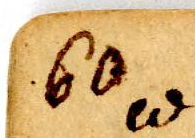60
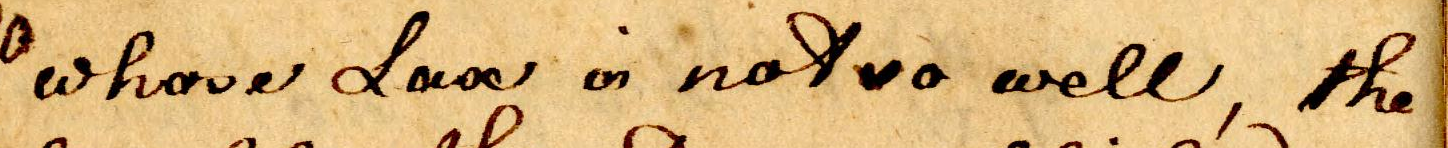whose Lax is not so well, the
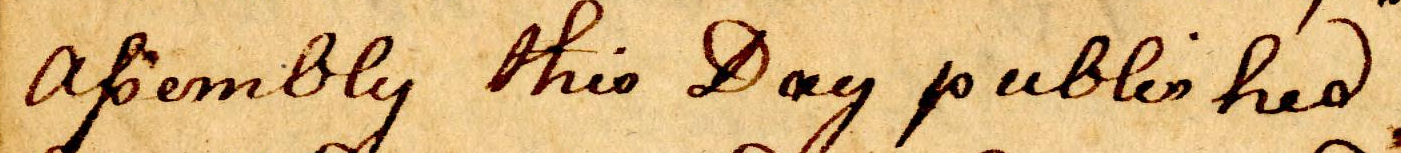Assembly this Day published
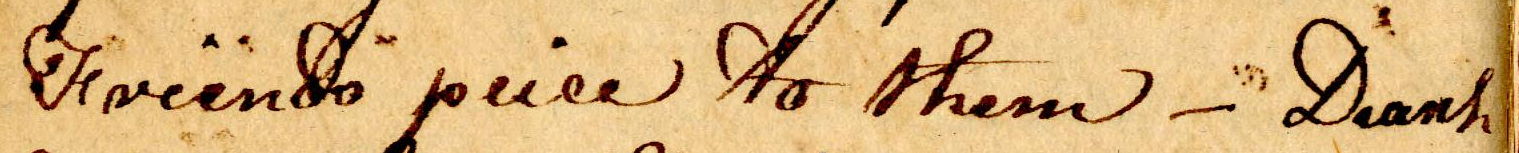Friends peice to them- Drank
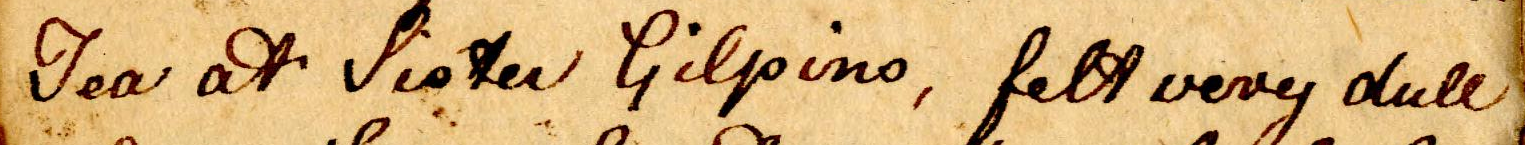Tea at Sister Gilpins, felt very dull
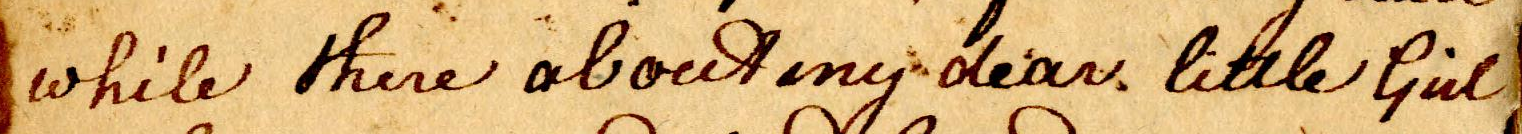while there about my dear little Girl
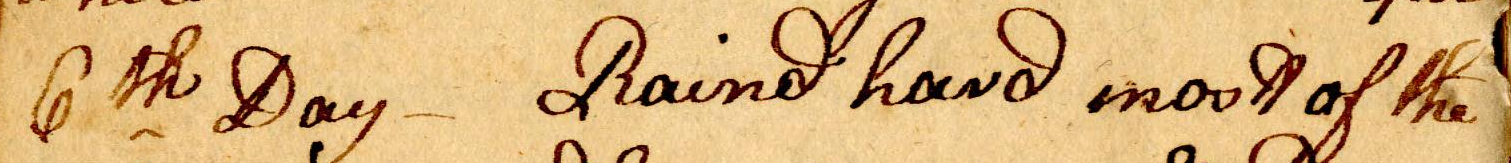6^th Day- Raind hard most of the
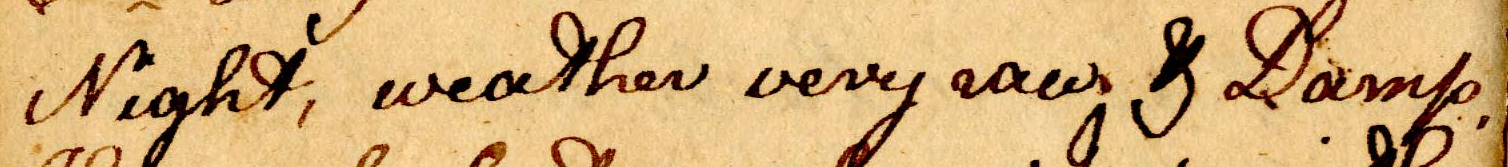Night, weather very raw & Damp
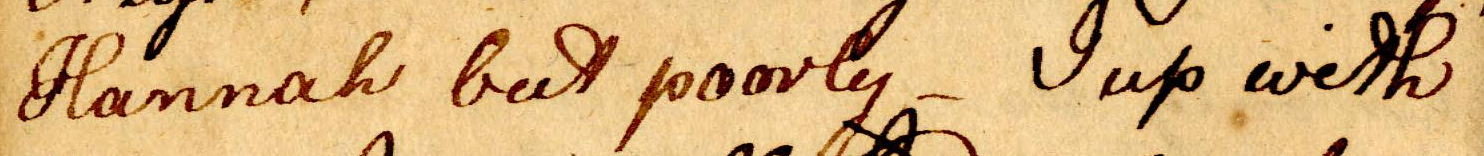Hannah but poorly- I up with
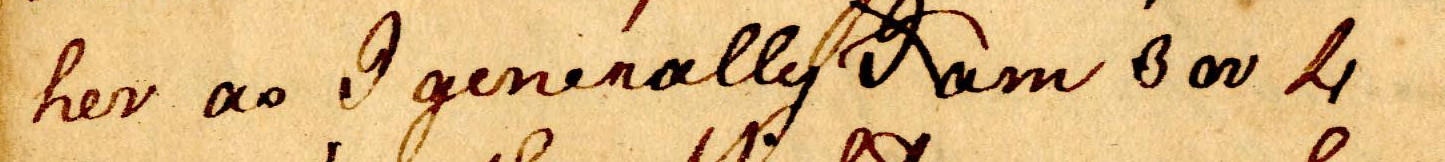her as I generally I am 3 or 4
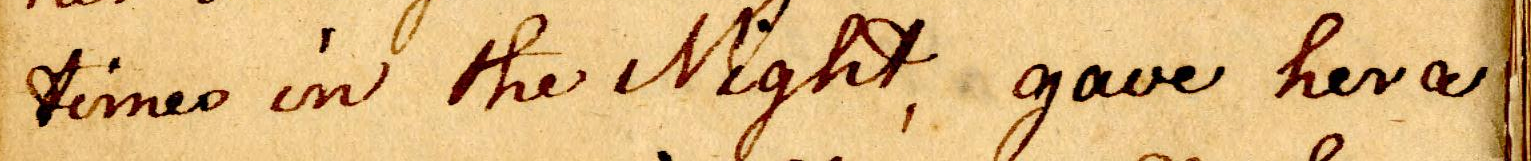times in the Night, gave her a
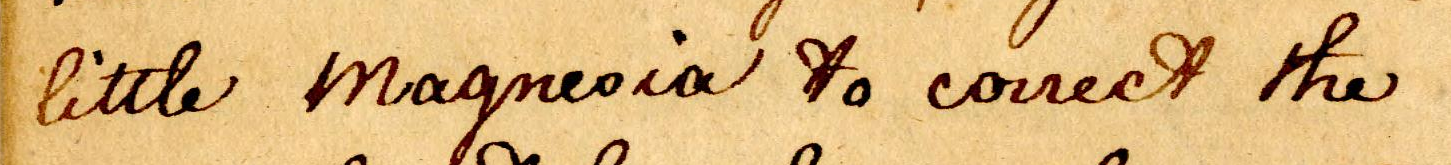little Magnesia to correct the
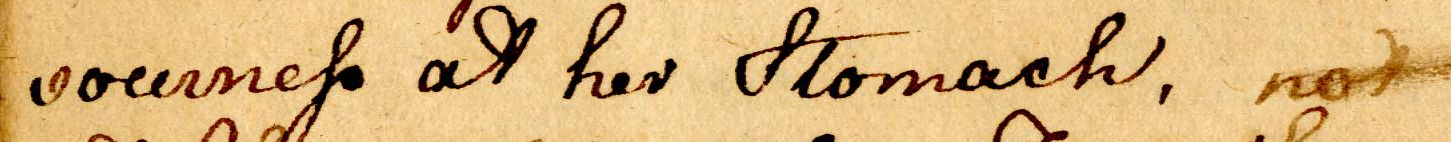sourness at her Stomach, not
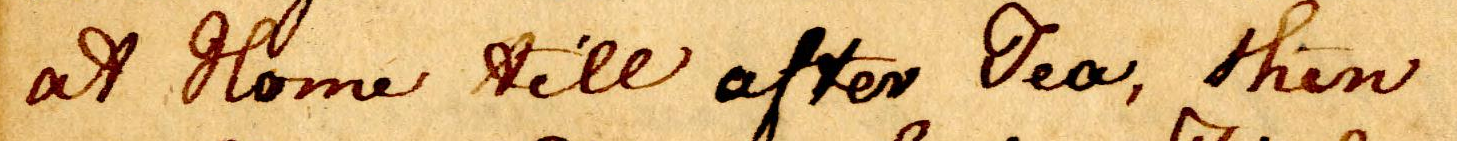at Home till after Tea, then
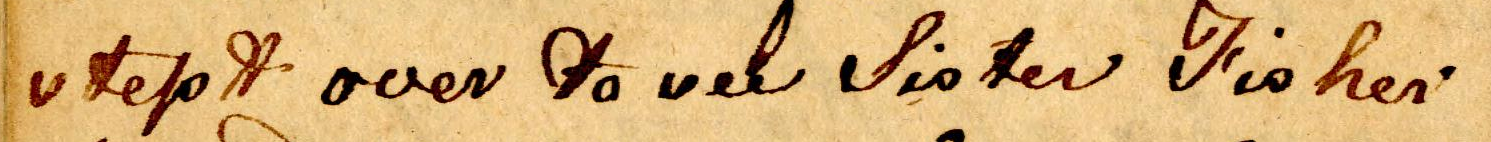stept over to see Sister Fisher
